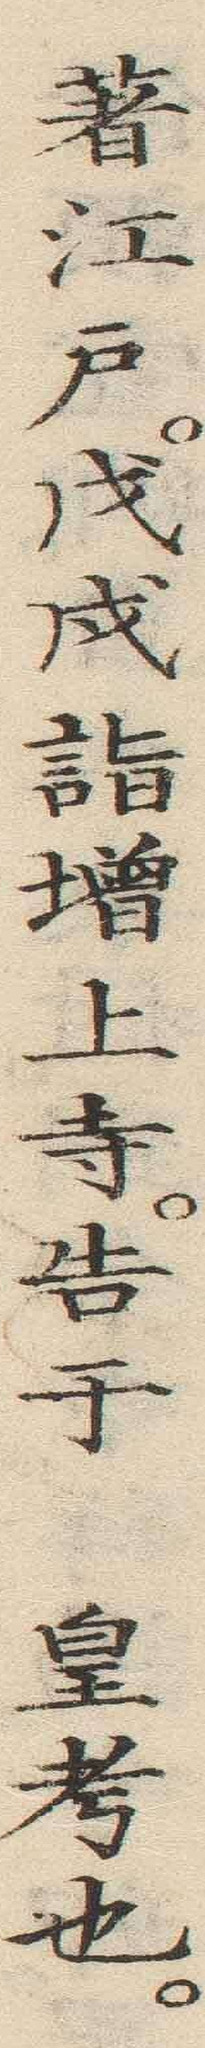著江戸。戊戌詣増上寺。告于皇考也。
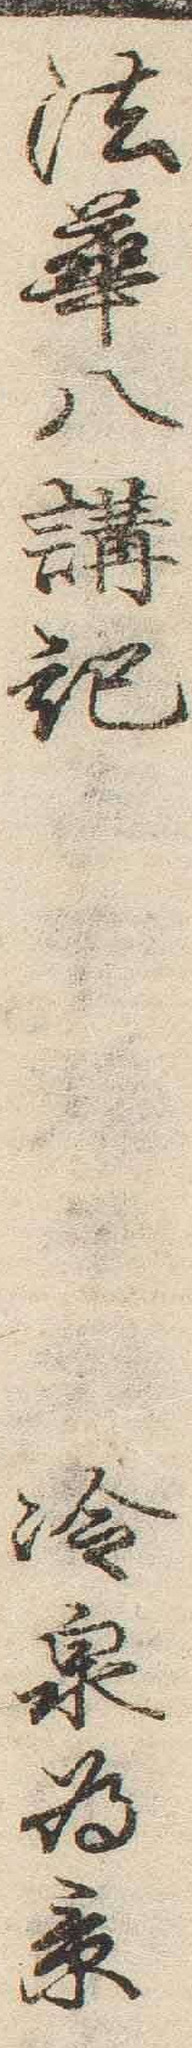法華八講記冷泉為景
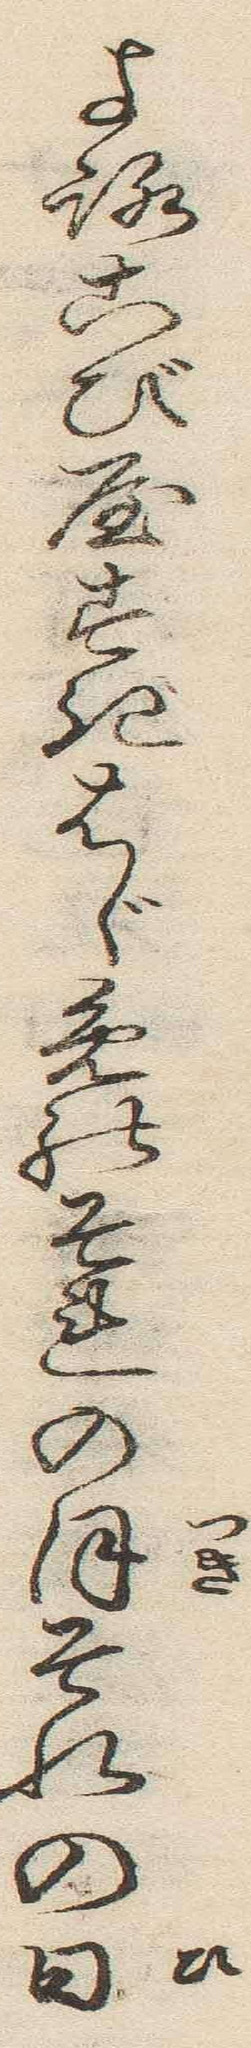よろこびやすきはじめのそれの月それの日
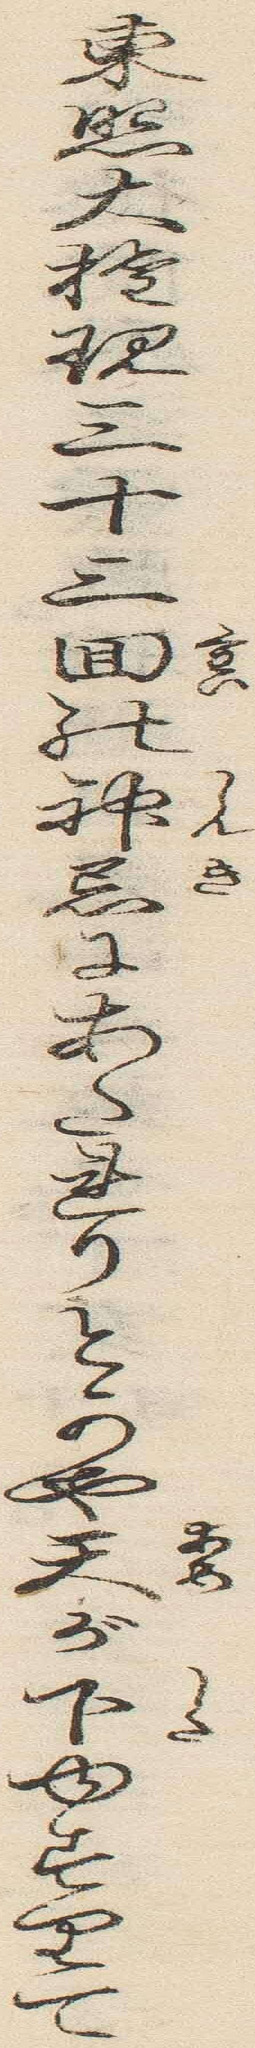東照大権現三十三回の神忌にあたれりとかや天が下ゆすりて
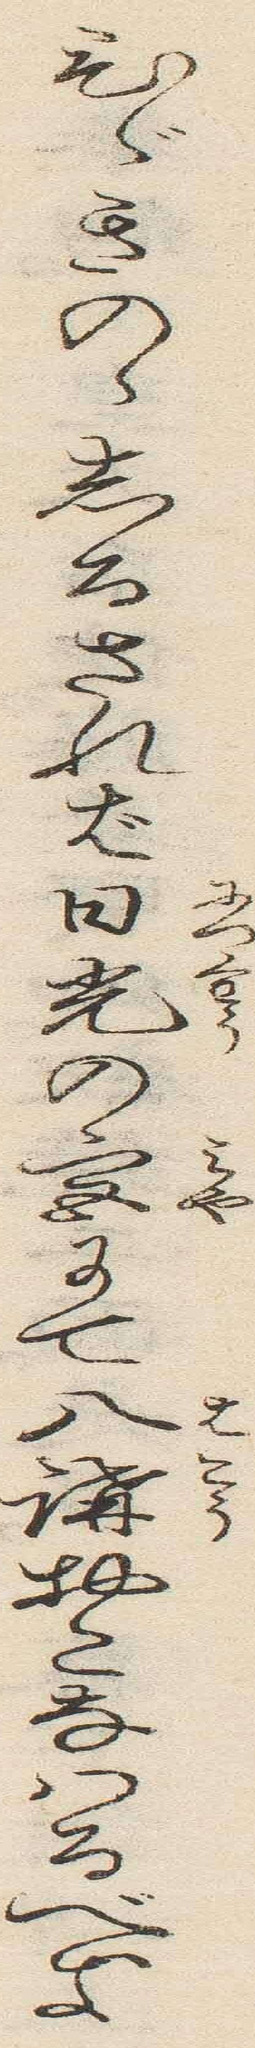ひゞきのゝしるされば日光の宮にて八講おこなはるべき
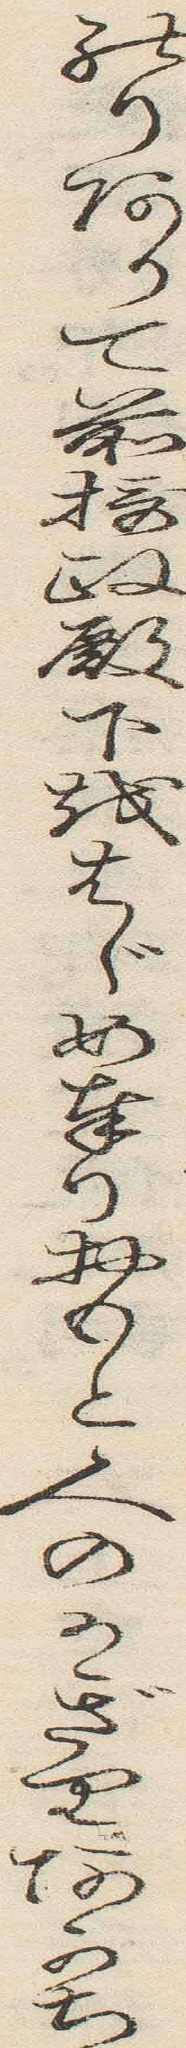のりありて前摂政殿下をはじめ奉りおもと人のかぎりあかち
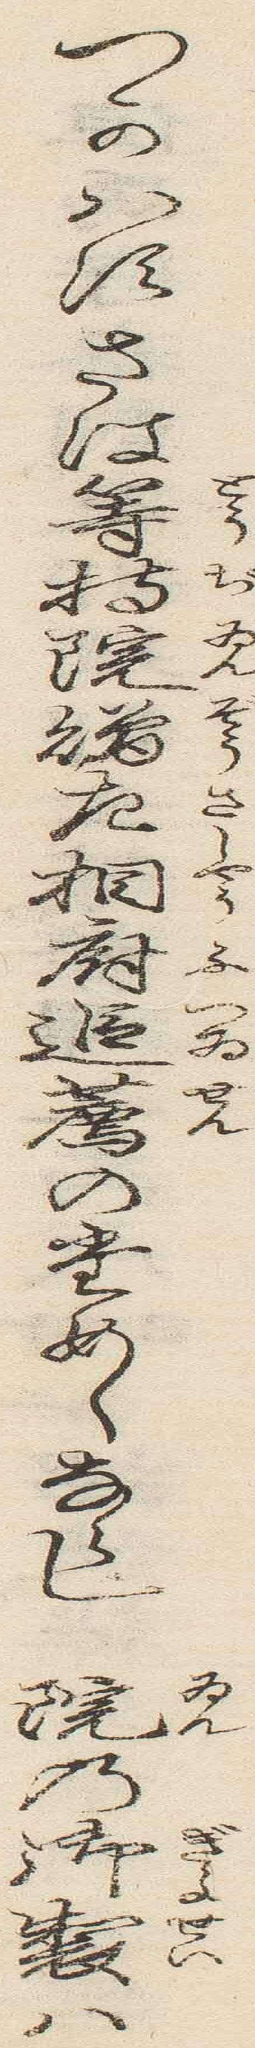つかはすさは等持院贈左相府追薦のためしならし院の御製は
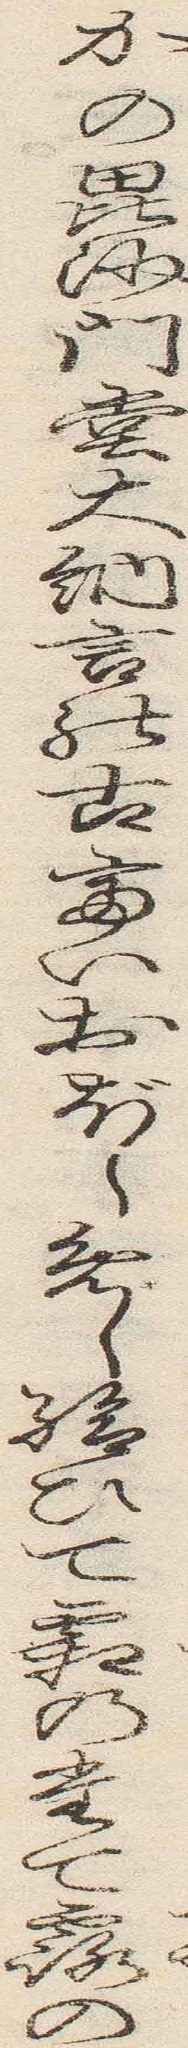かの毘沙門堂大納言の古富いおぼしめし給ひて霜のたて露の
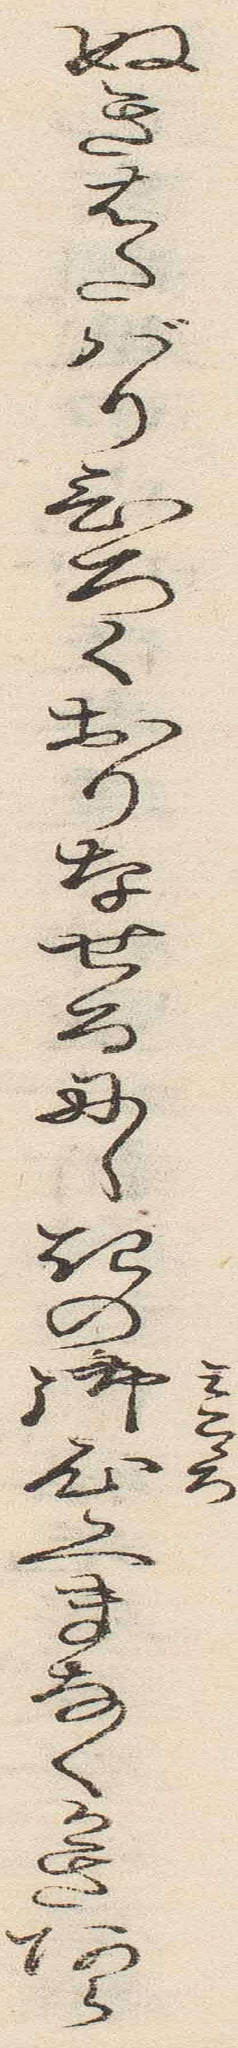ぬきはたばりひろくおりなせるにしきの御心くまなくかきあら
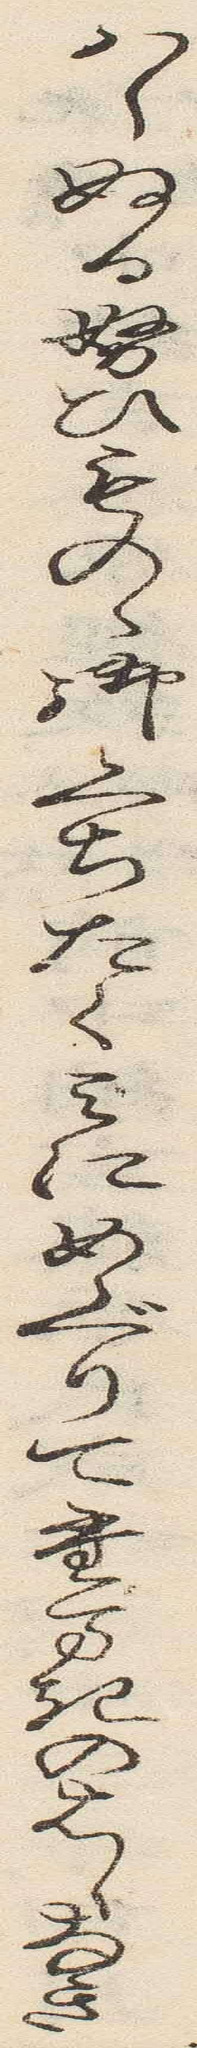はしぬるぬひものゝ御くちたくみにめぐりてたまきのはしなき
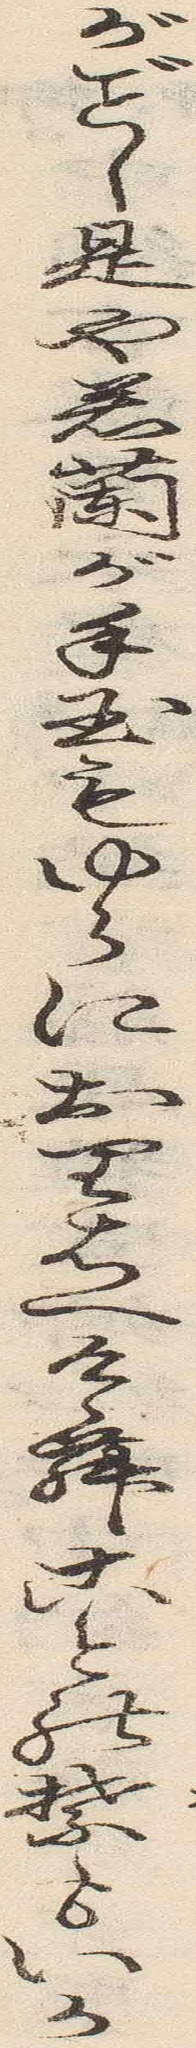がごとし是や若蘭が手玉もゆらにおりはへけむことの葉もいか
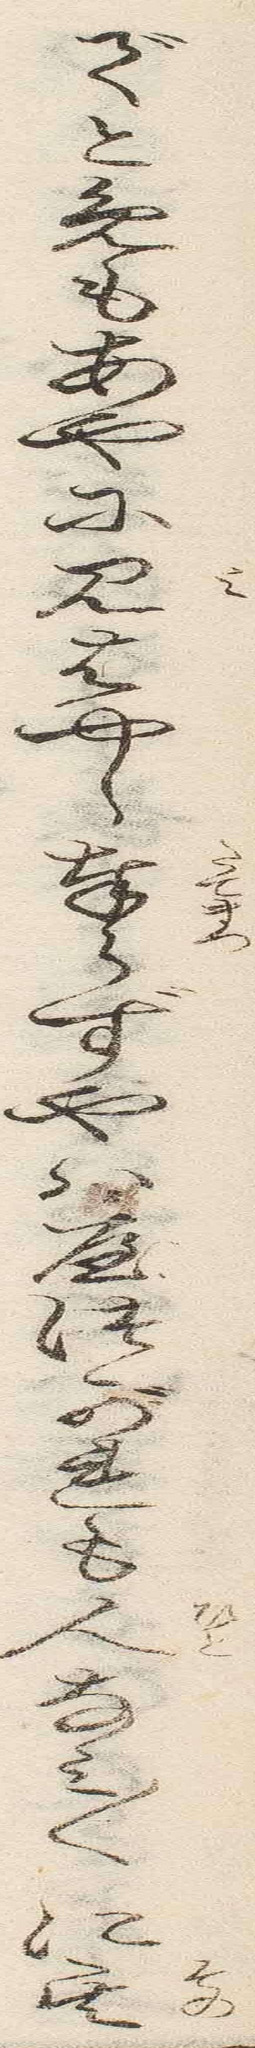でとめもあやに見はやし奉らずやはやつがれも人なみ〳〵に其
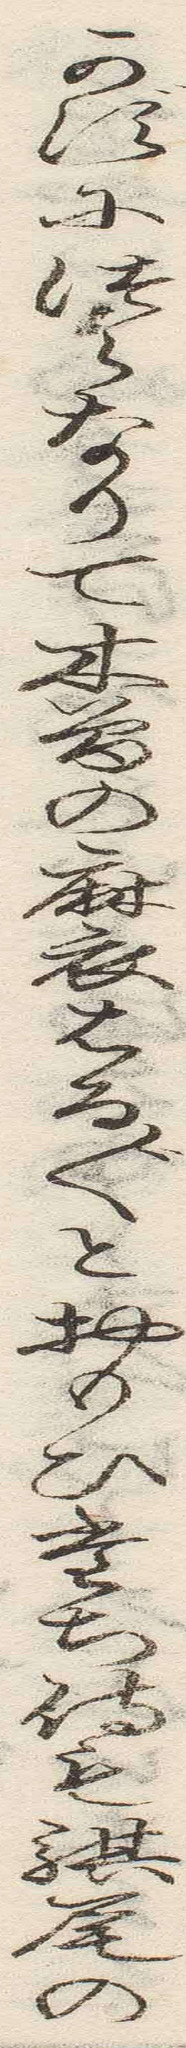かずにつらなりて木曽の麻衣はる〴〵とおもひたち侍も騏尾の
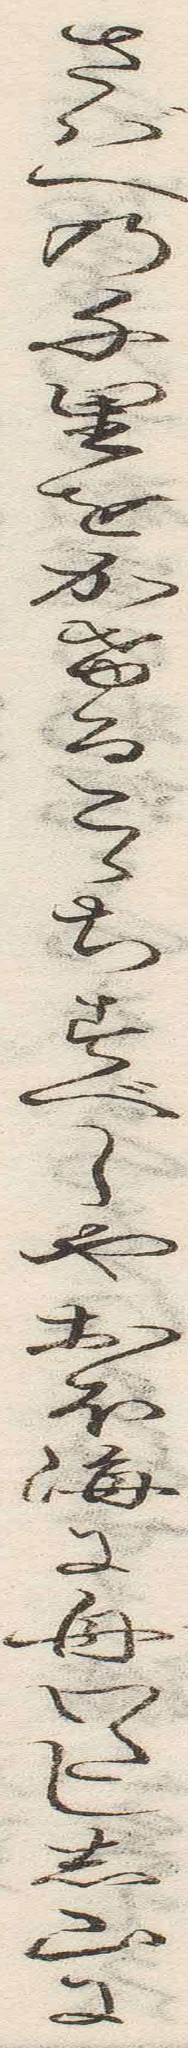さばへの千里をかけるこゝちすべしやおほ海に舟わたしし山に
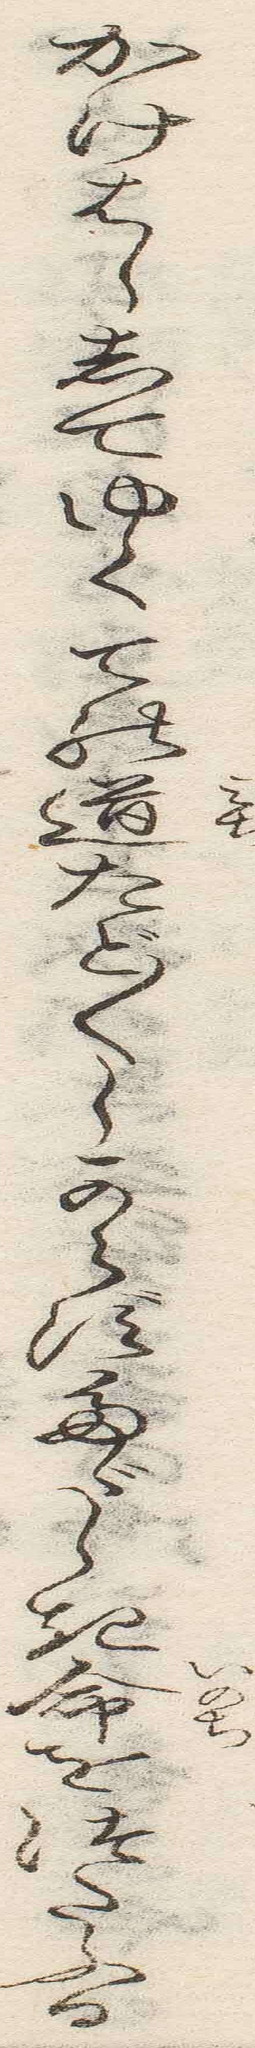かけはししてゆくての道たど〳〵しからずたゞしき命をつたふる
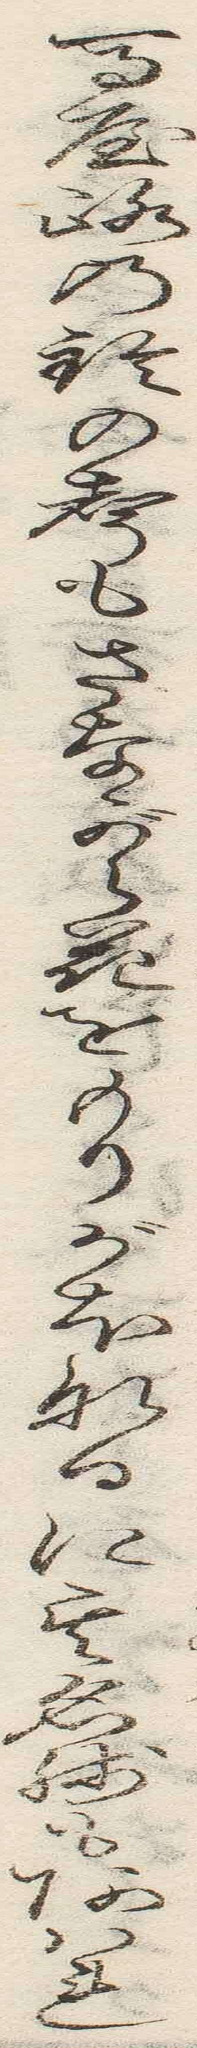馬屋路の鈴の声もさながら花をもりがほなるに其名残もあはれ
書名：日光山志
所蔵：東京学芸大学附属図書館 国文学研究資料館
